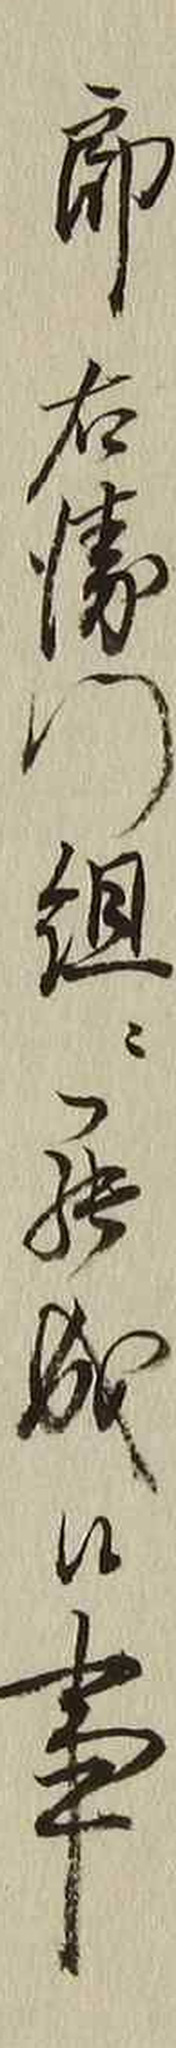郎右衛門組ニ罷成候事
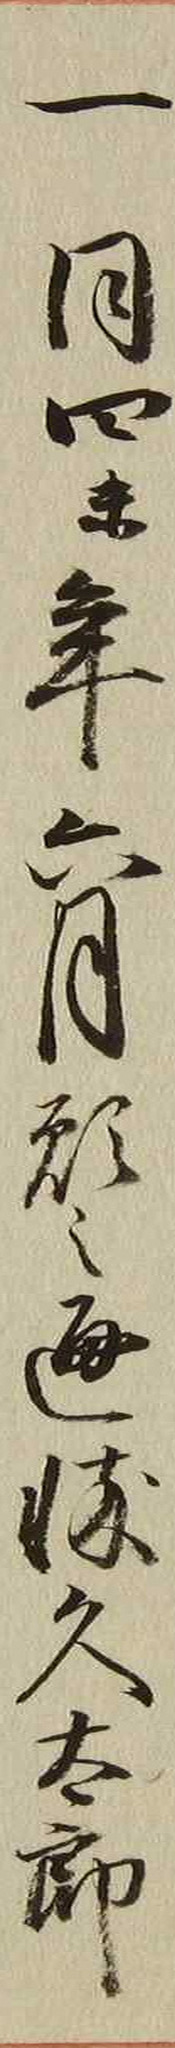一同四未年六月願之通忰久太郎
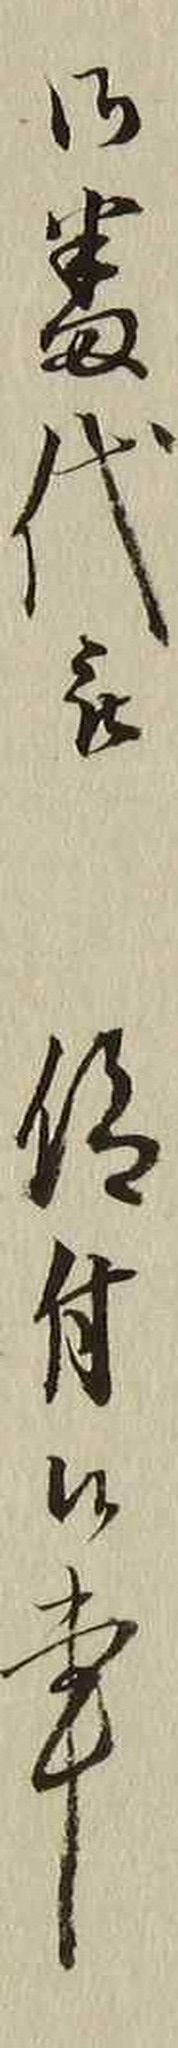御番代被仰付候事
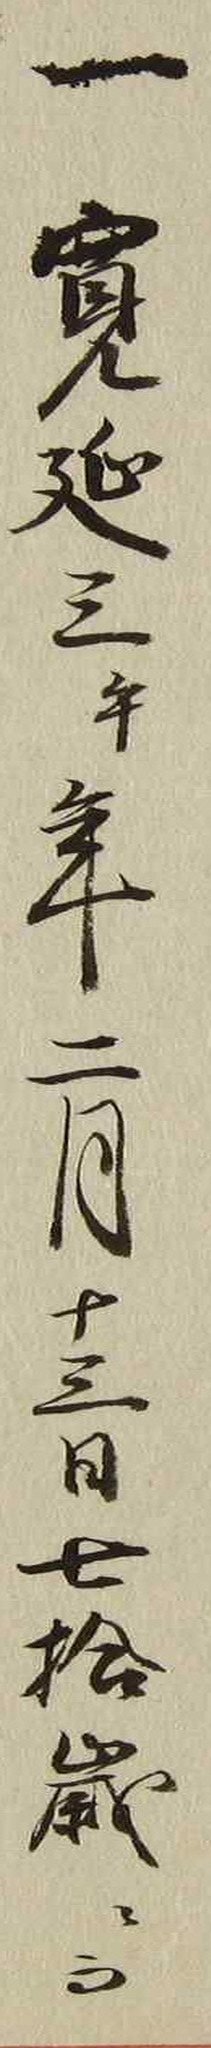一寛延三午年二月十三日七拾歳ニ而
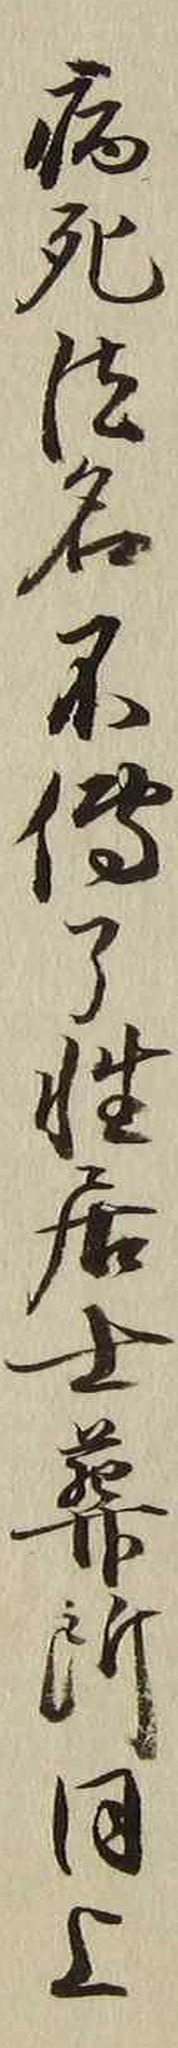病死法名不伝了性居士葬所同上
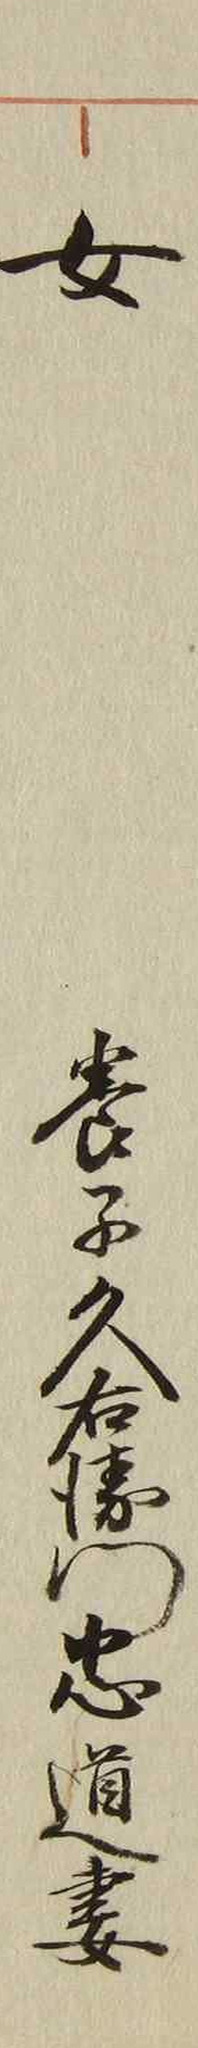女養子久右衛門忠道妻
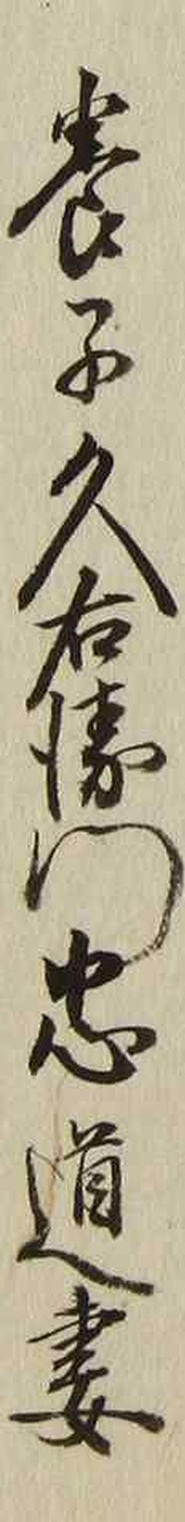女養子久右衛門忠道妻
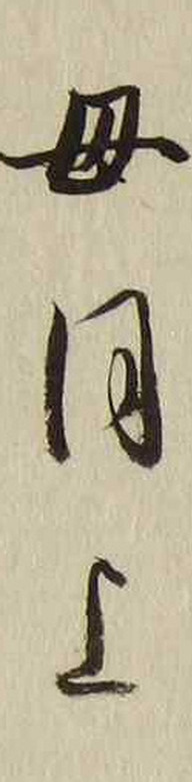母同上

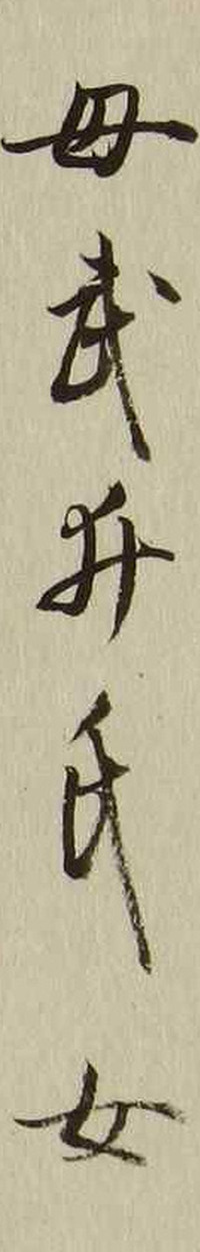母武井氏女
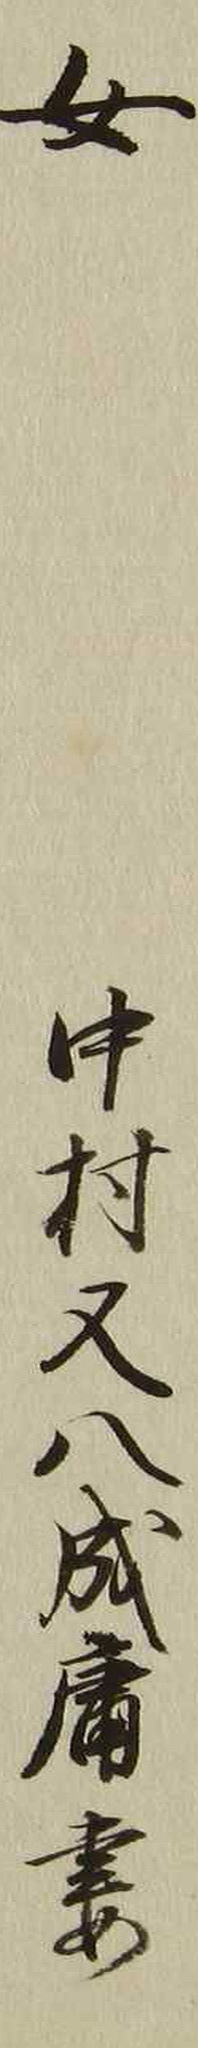女中村又八成庸妻
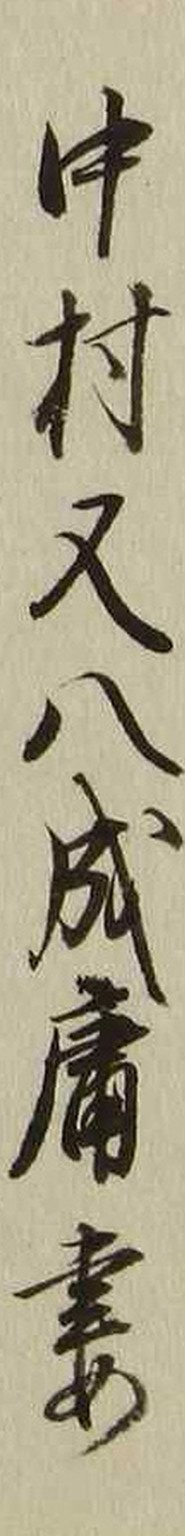女中村又八成庸妻
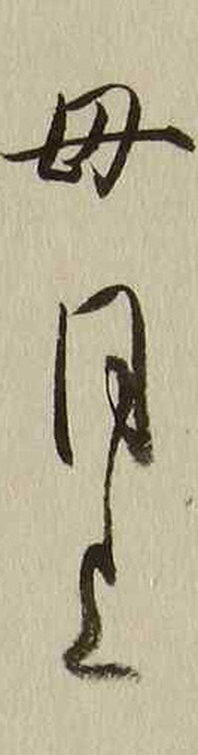母同上
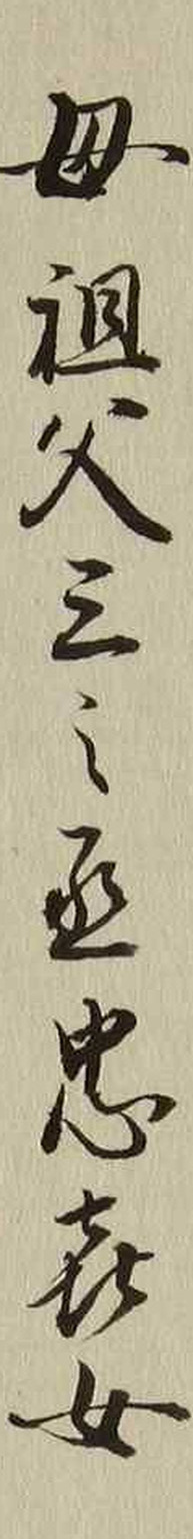母祖父三之丞忠喜女
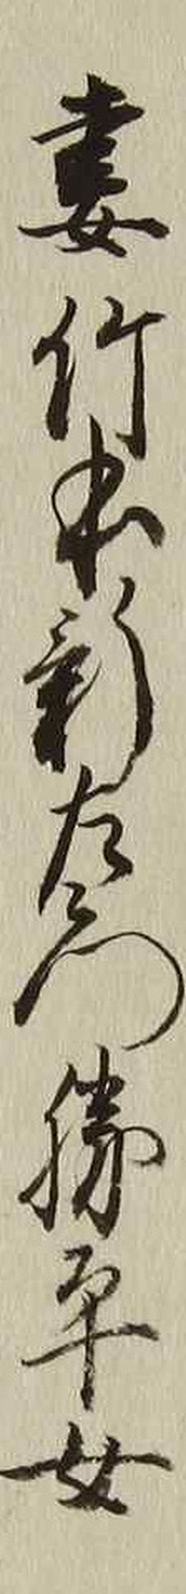妻竹本新左衛門勝平女
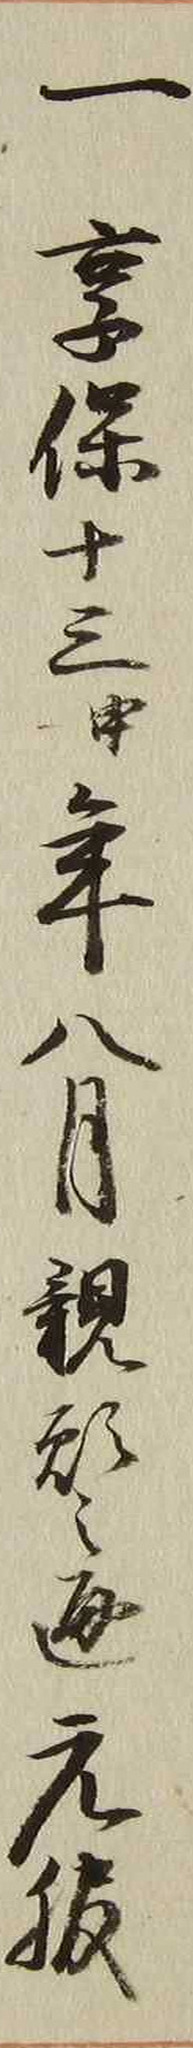一享保十三申年八月親願之通元服
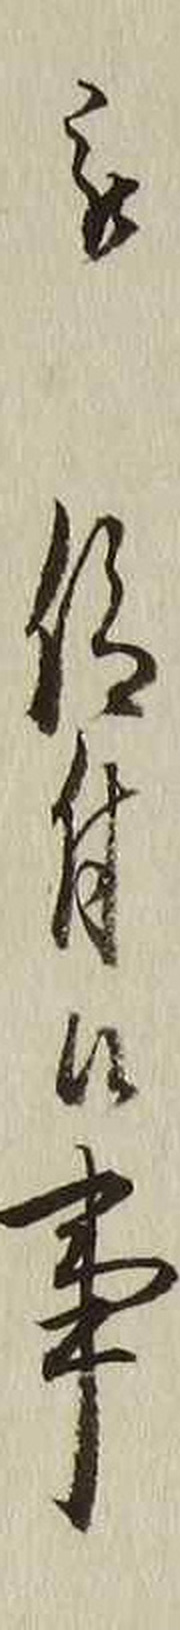被仰付候事
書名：諸士系譜　巻之69　を之部3
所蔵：会津若松市立会津図書館
